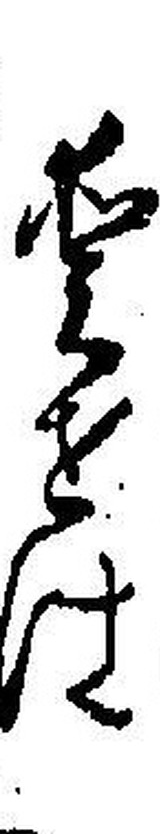愛をは
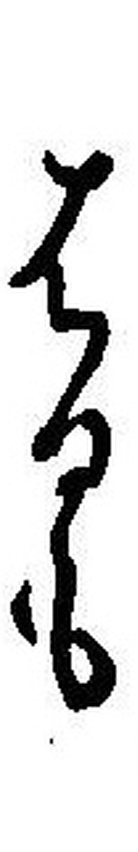はるも
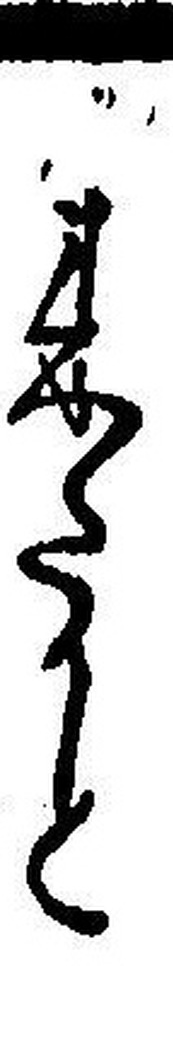来たかと
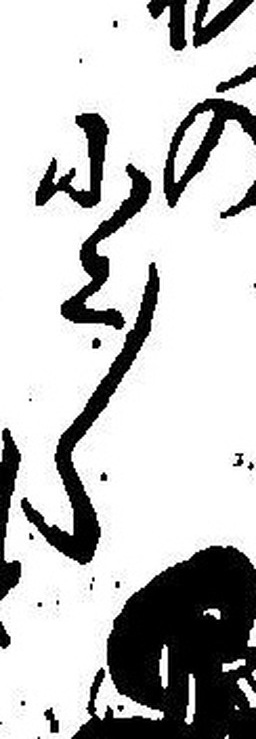にこ〳〵と
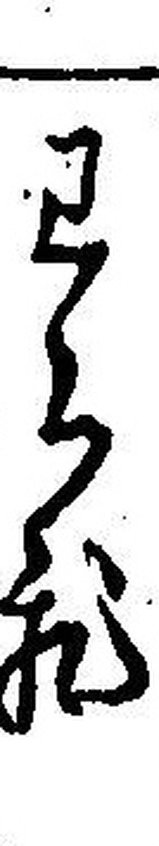わらひ
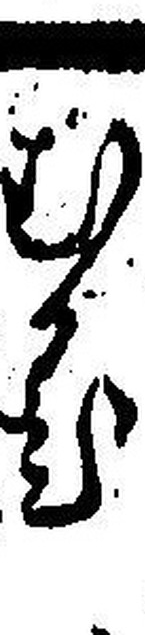むかひ
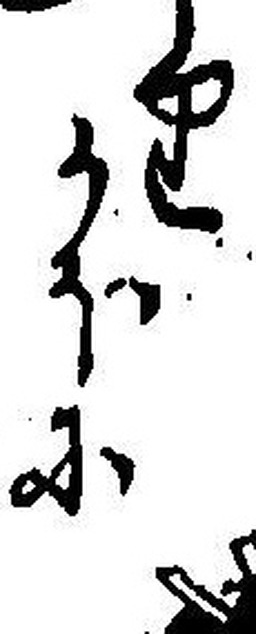かほに
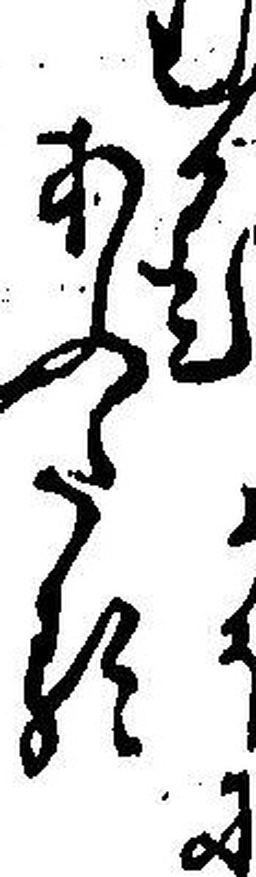あふたる
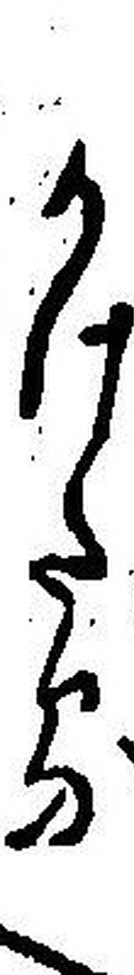かけたる
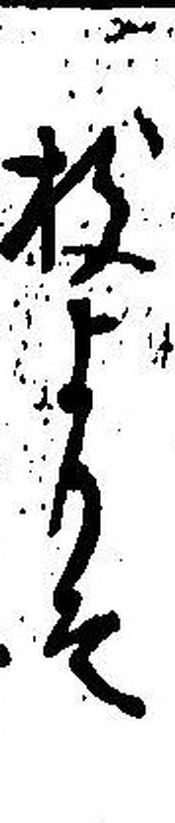枝よりそ

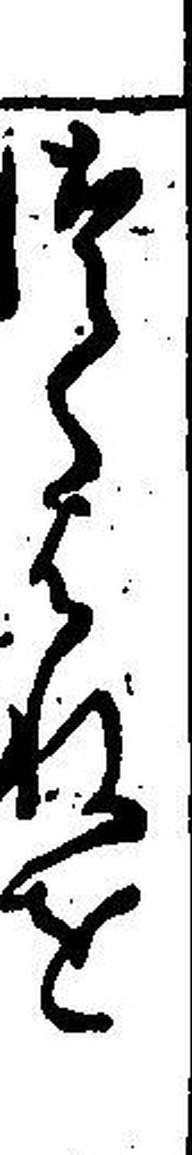つくはねを
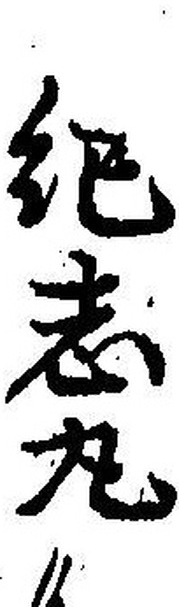紀志丸
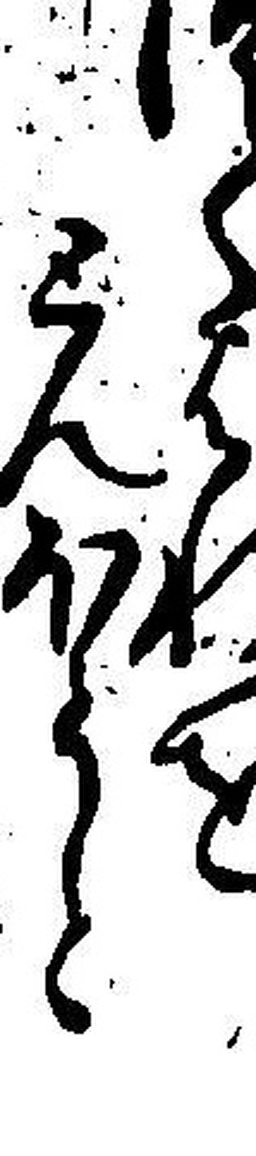とんほうと
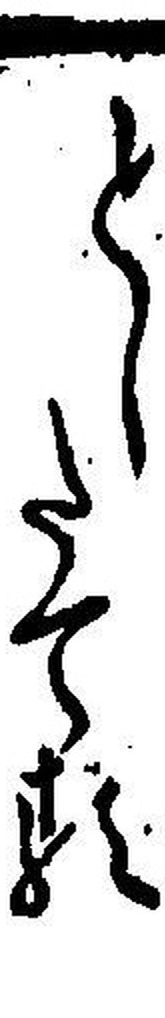としたてる
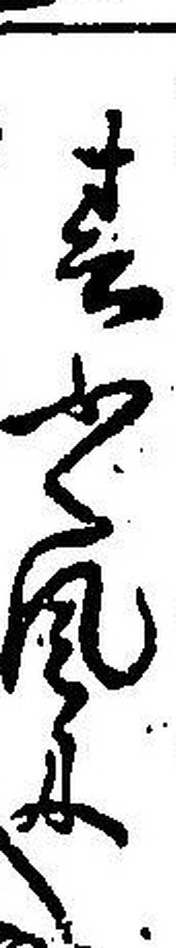春ふく風に
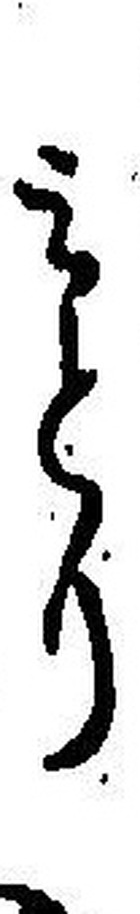みとり
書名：どうれ百人一首 / 鹿都部真顔(狂歌堂)編
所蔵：東京大学総合図書館 General Library in the University of Tokyo, JAPAN
